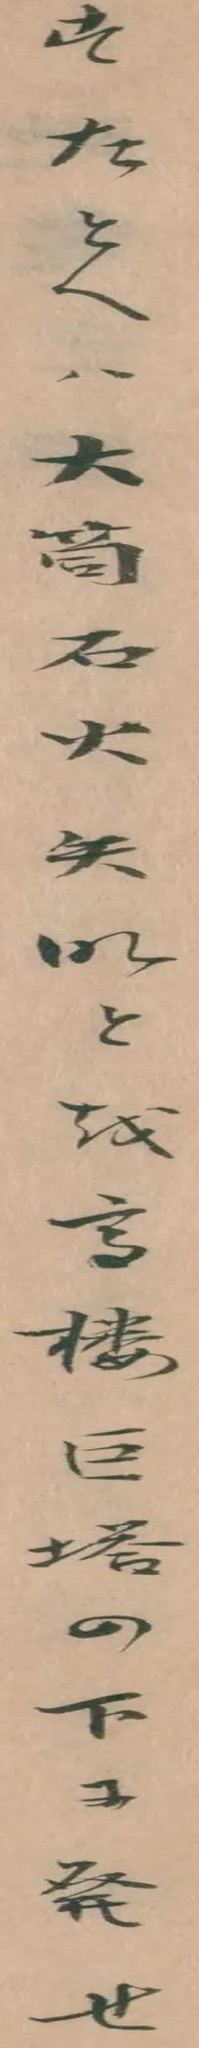すたとへは大筒石火矢なとを高楼巨塔の下に発せ
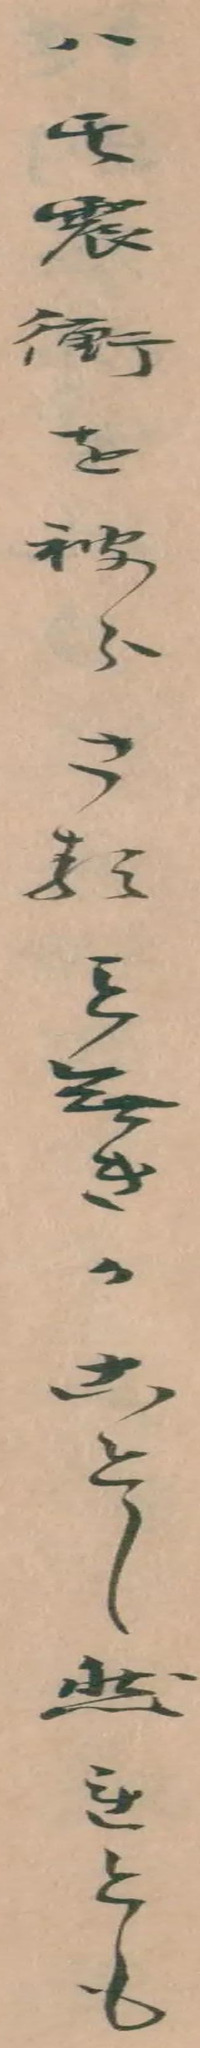は其震衝を被らさること無きかことし然れとも
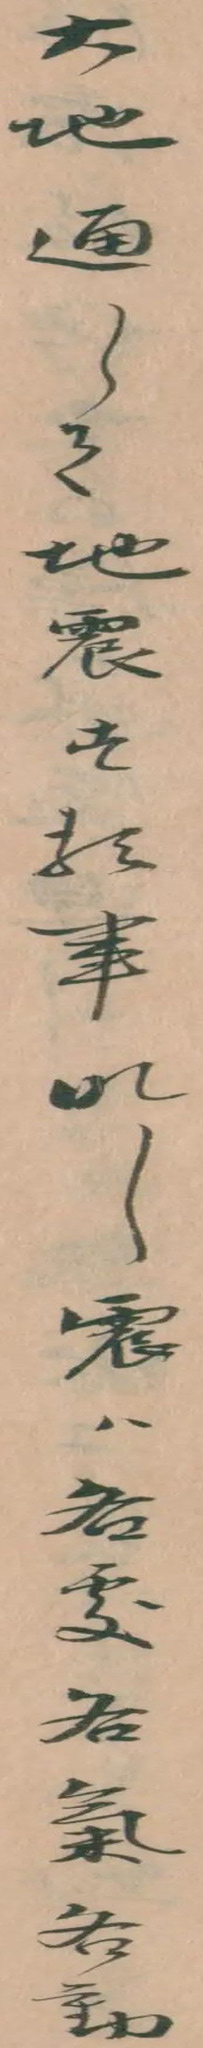大地通して地震する事なし震は各処各気各動
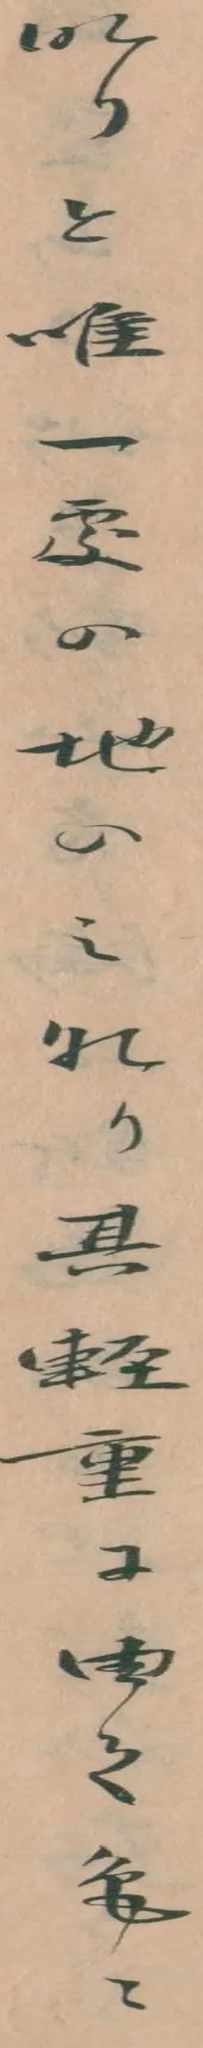なりと唯一処の地のみなり其軽重に由て色々

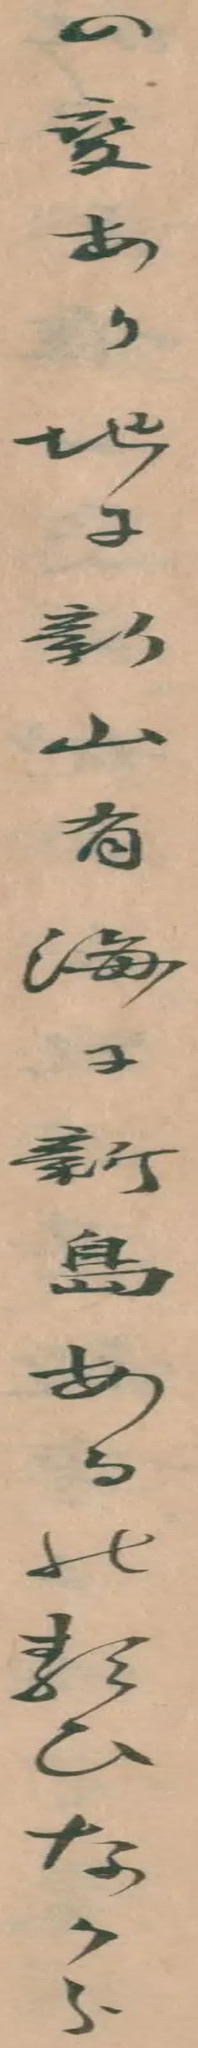の変あり地に新山有海に新島あるの類ひなから
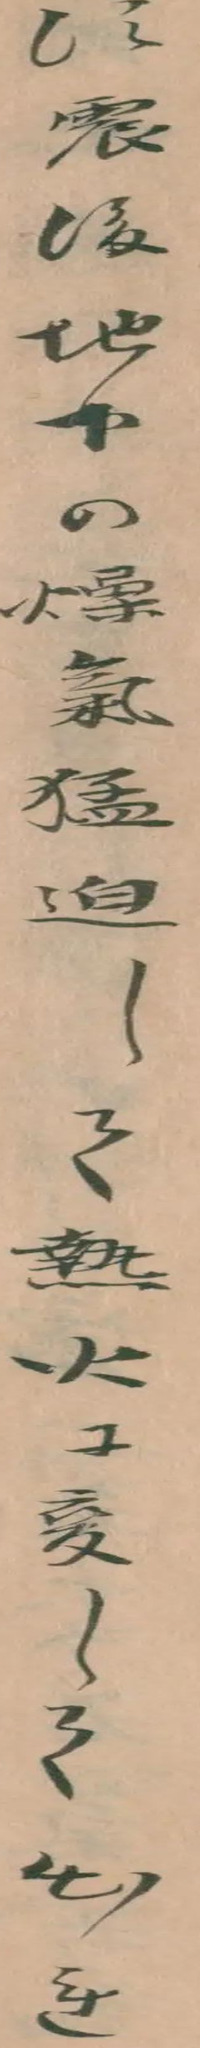す震後地下の燥気猛迫して熱火に変して出れ
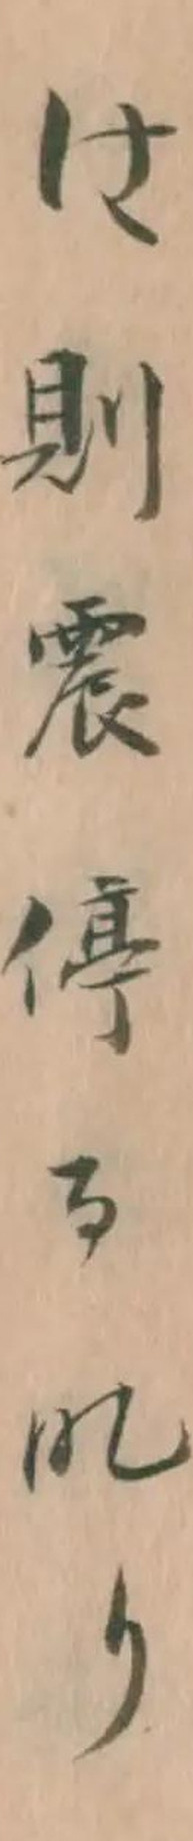は則震停るなり
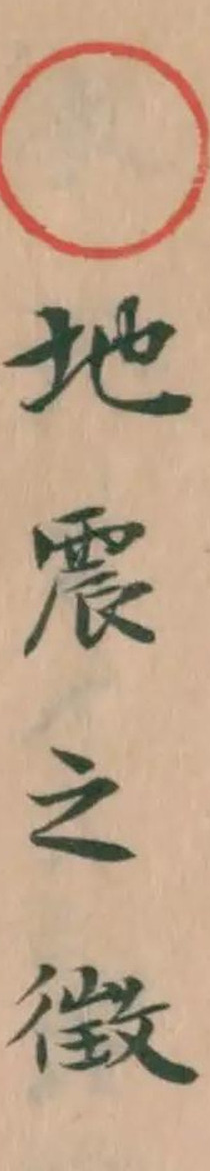〇地震の徴
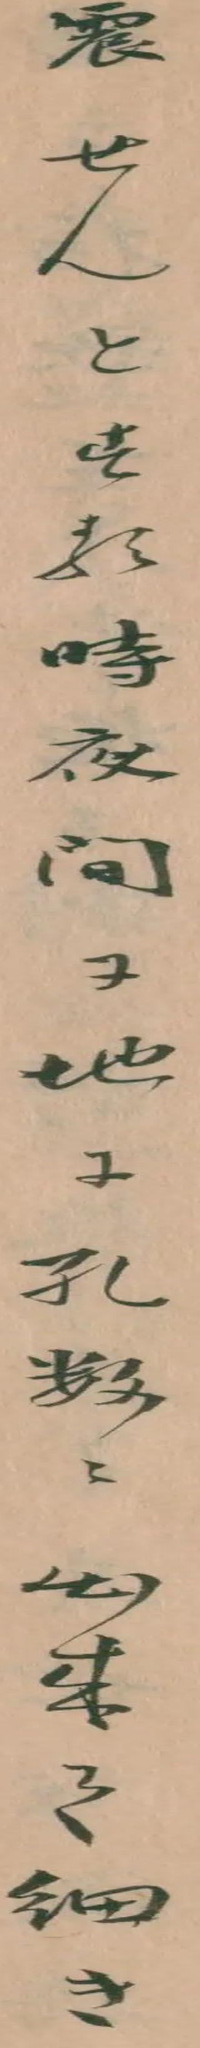震せんとする時夜間に地に孔数々出来て細き
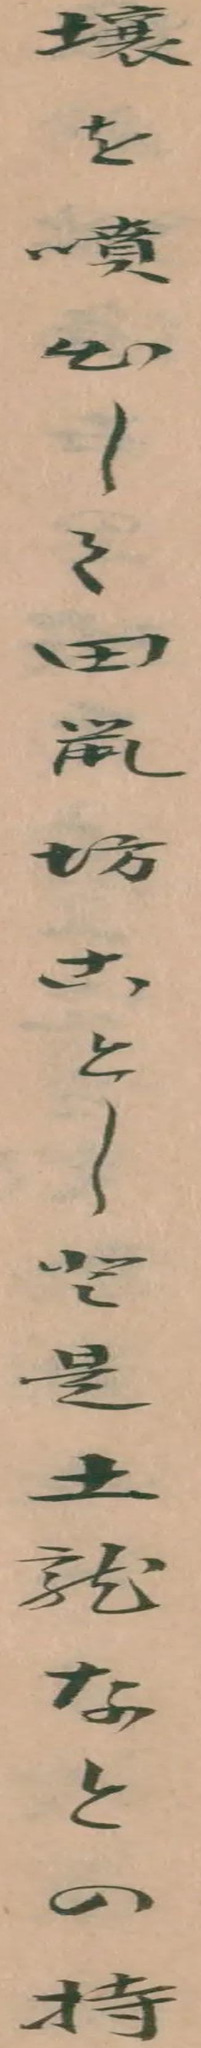壌を噴出して田鼠坊ことしと是土龍なとの持
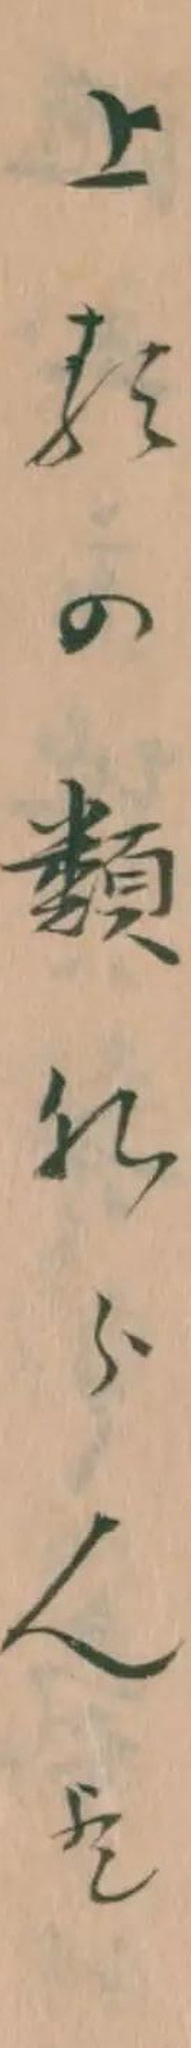上るの類ならんか
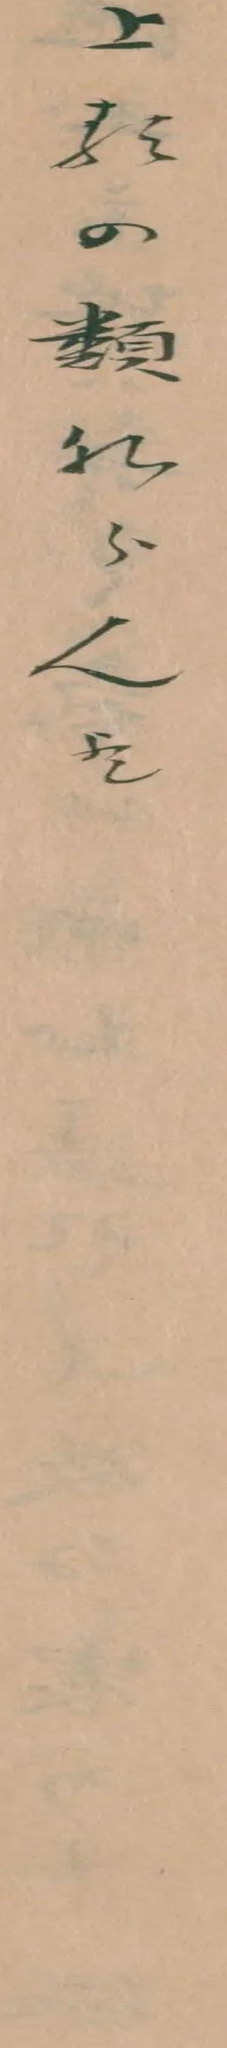上るの類ならんか
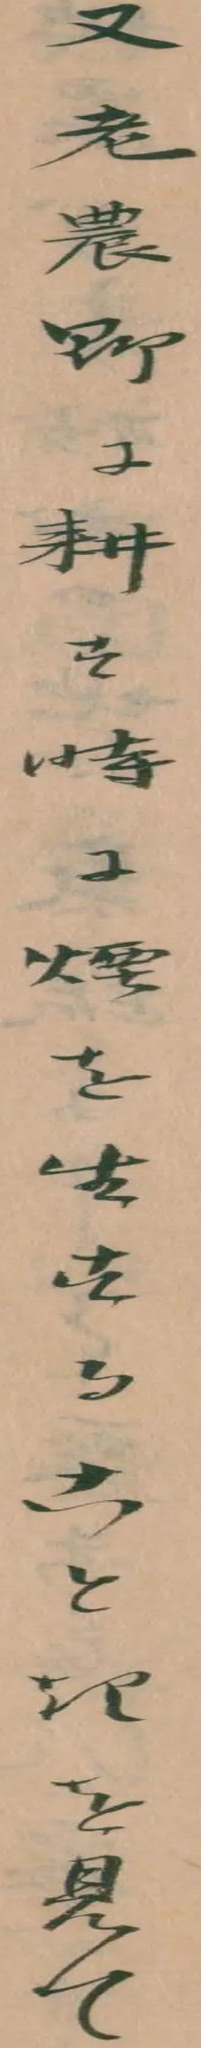又老農野に耕す時に煙を生することきを見て
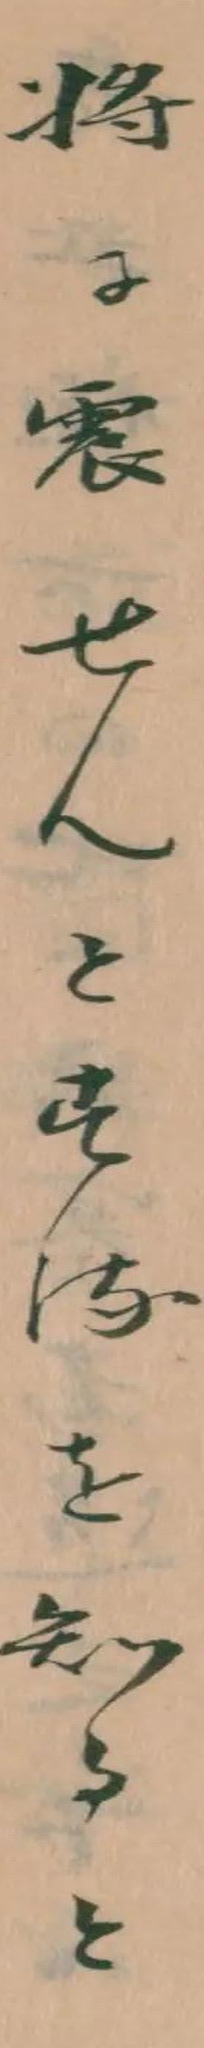将に震せんとするを知ると
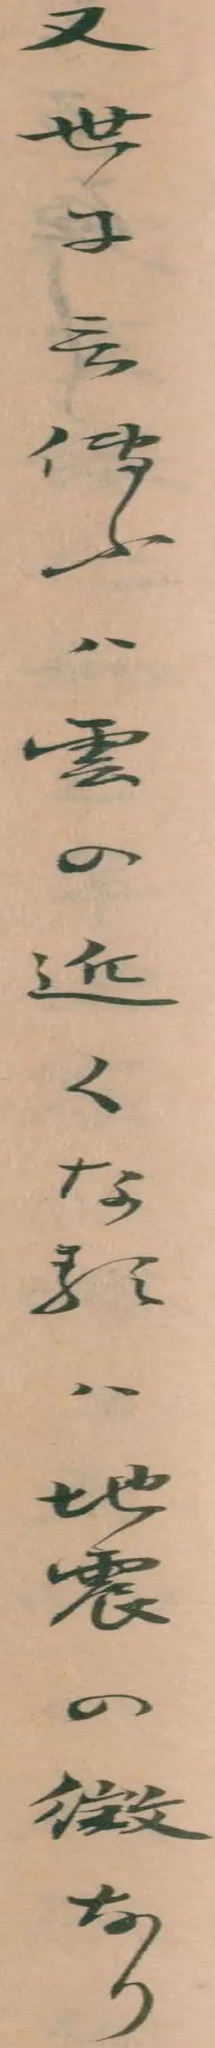又世に言伝ふは雲の近くなるは地震の徴なり
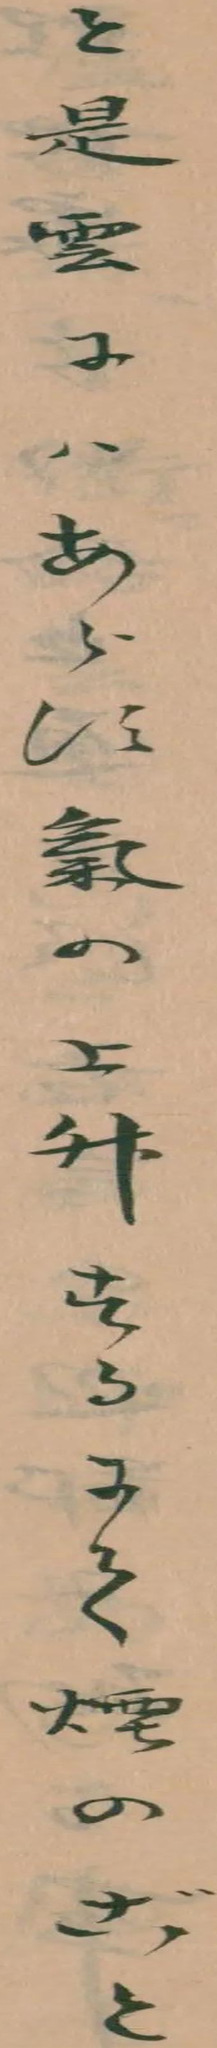と是雲にはあらす気の上昇するにて煙のごと
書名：地災撮要. 巻5-6(地震之部)
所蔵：国立国会図書館 National Diet Library, JAPAN
